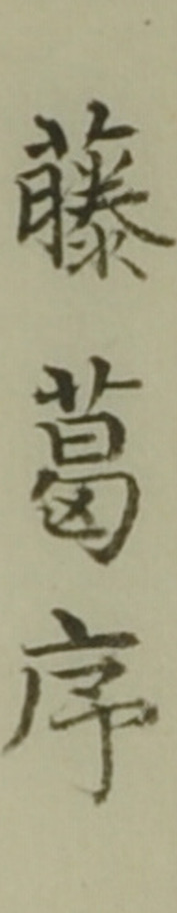藤葛序
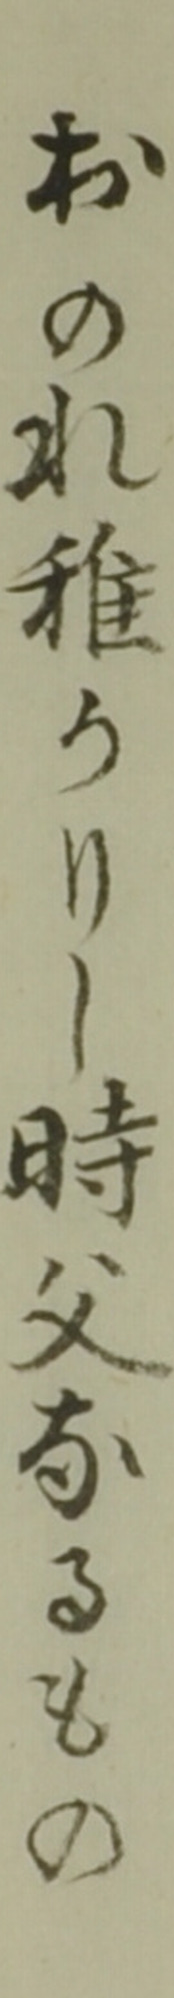おのれ稚かりし時父なるもの
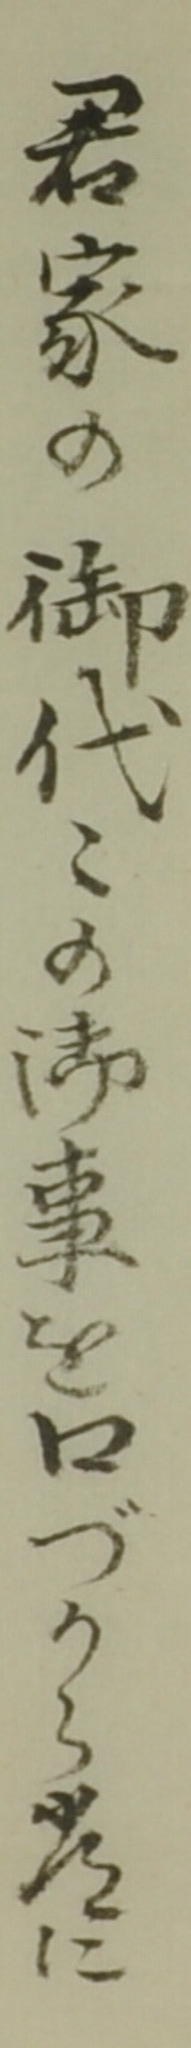君家の御代々の御事を口づから常に
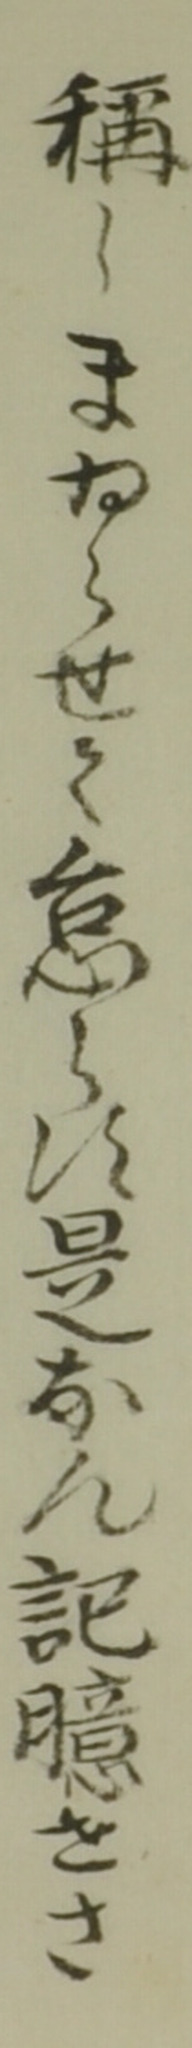称しまゐらせて怠らす是なん記臆せさ
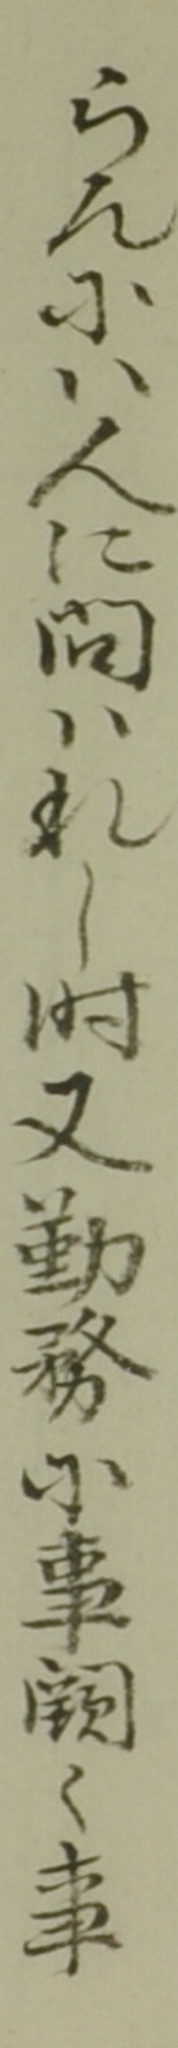らんには人に問はれし時又勤務に事闕く事
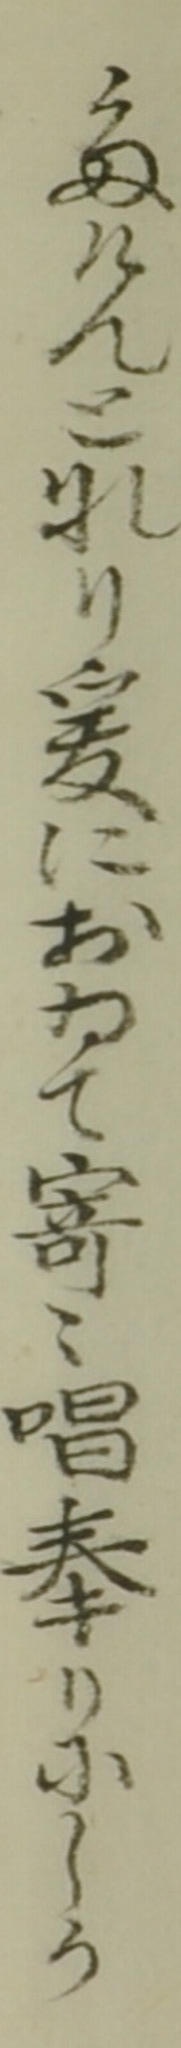多けんとなり爰におゐて寄々唱奉りにしか

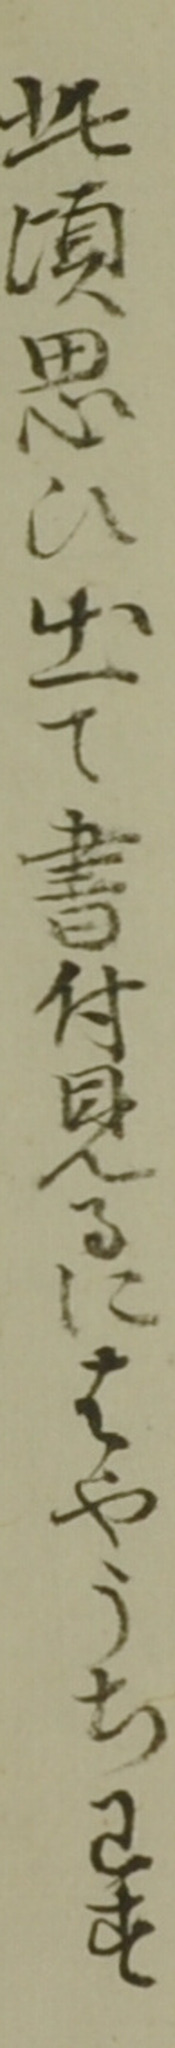此頃思ひ出て書付見るにはやうちわす
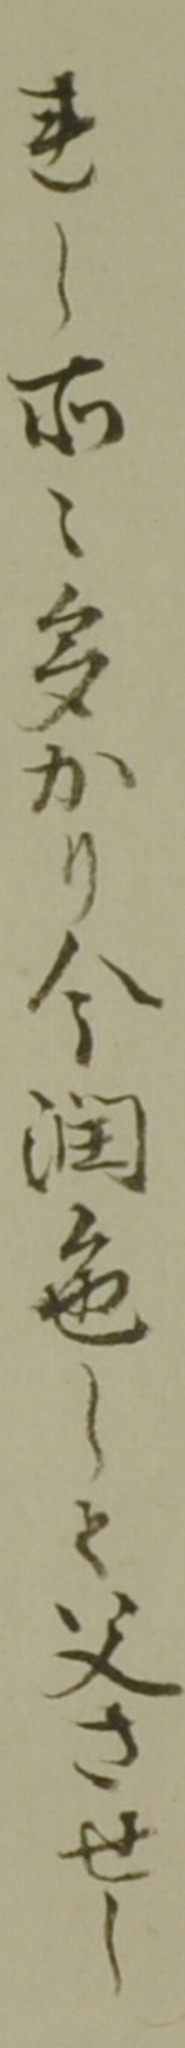れし所々多かり今潤色して父させし
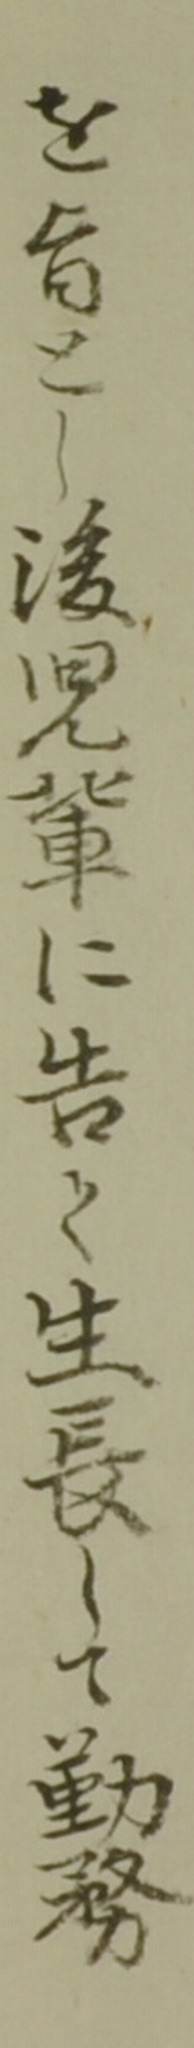を旨とし後児輩に告て生長して勤務
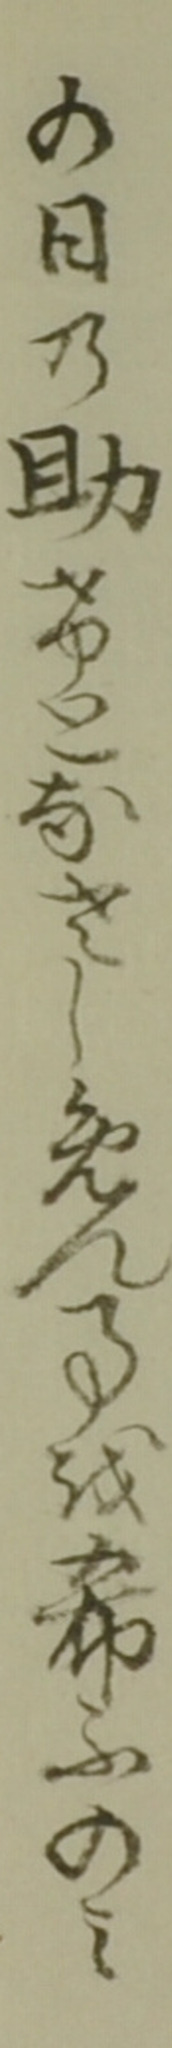の日の助けとなさしめん事を希ふのみ
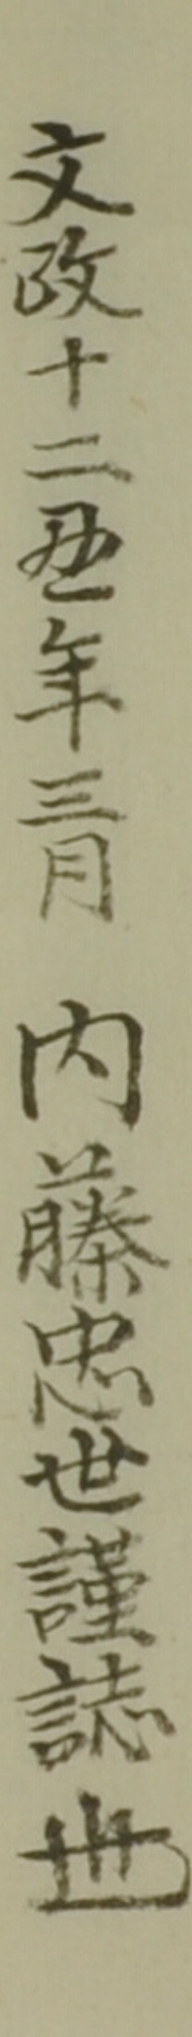文政十二丑年三月内藤忠世謹誌
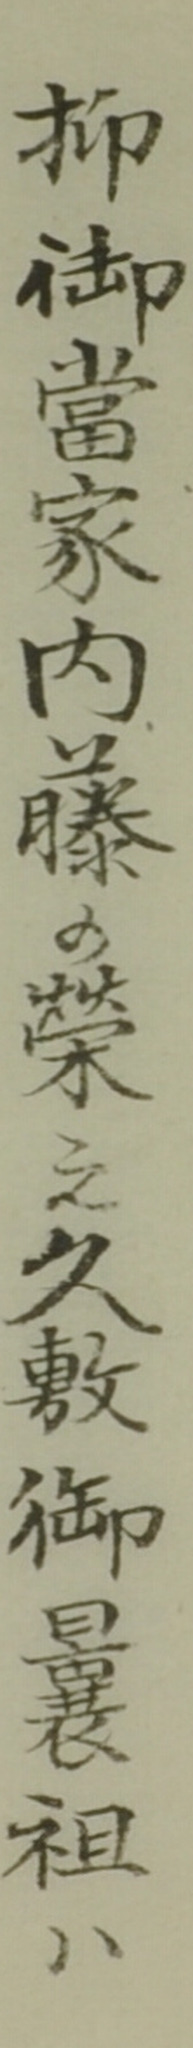抑御当家内藤の栄え久敷御曩祖は
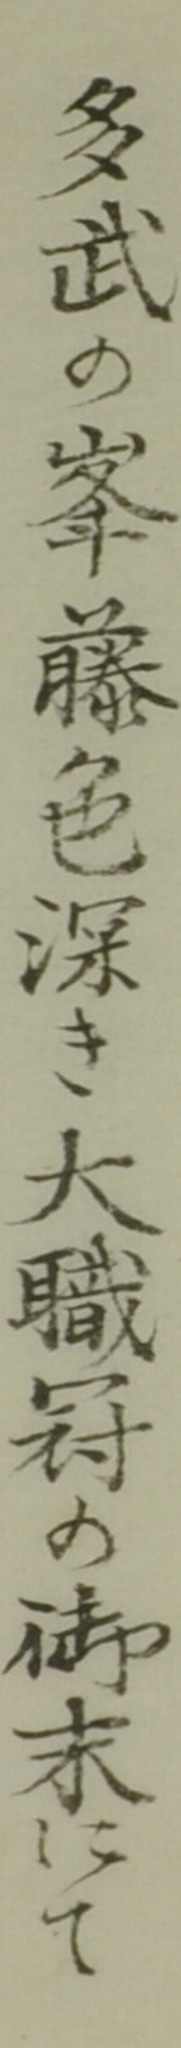多武の峯藤色深き大職冠の御末にて
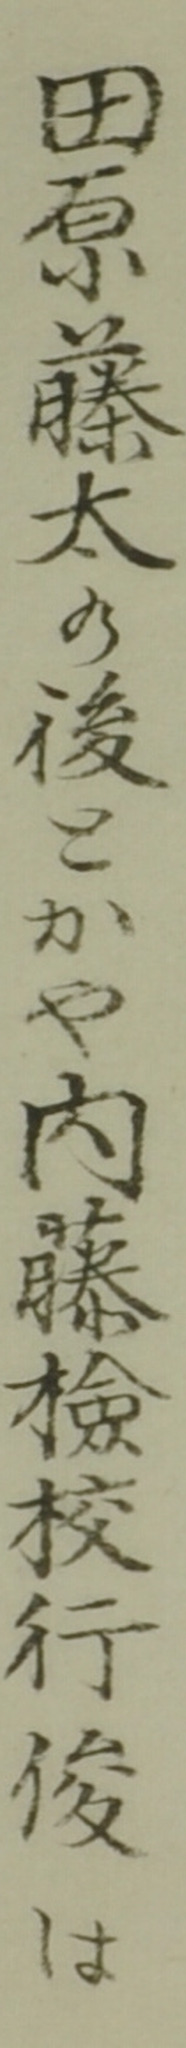田原藤太の後とかや内藤検校行俊は
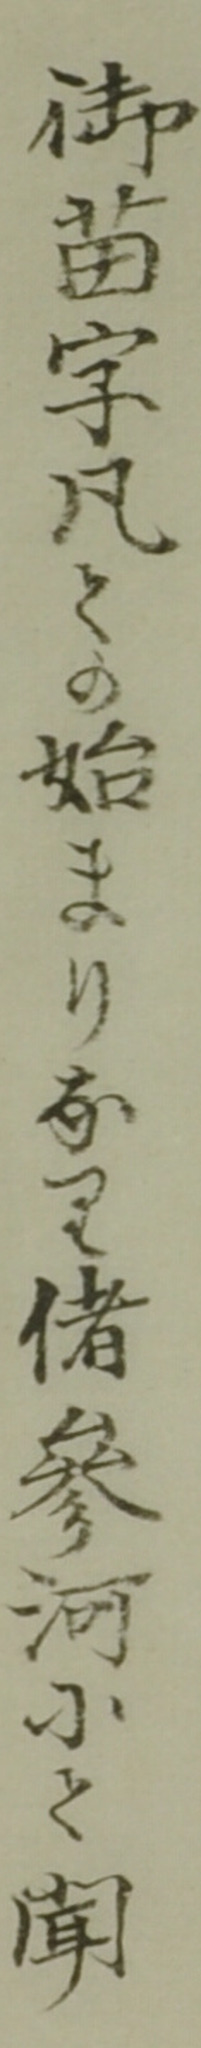御苗字凡ての始まりなり偖参河にて聞
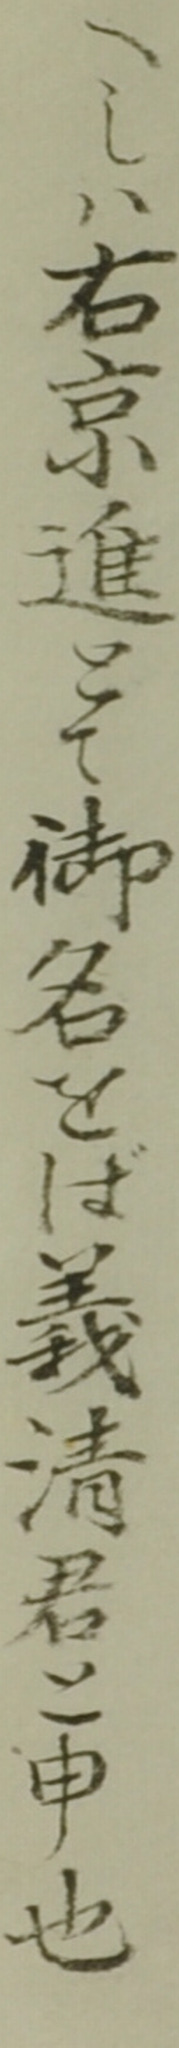へしは右京進とて御名をば義清君と申也
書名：藤葛（全）
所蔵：伊那市立高遠町図書館・合同会社AMANE
